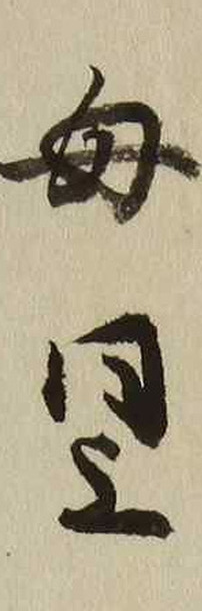母同上
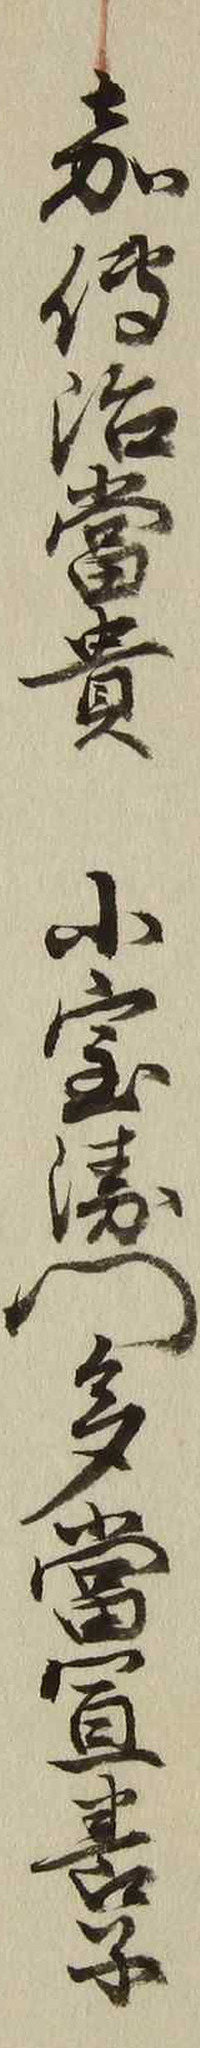嘉伝治当貴小室衛門多当宜養子
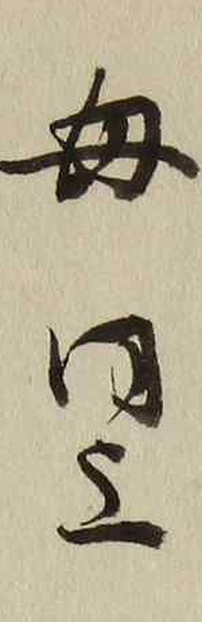母同上
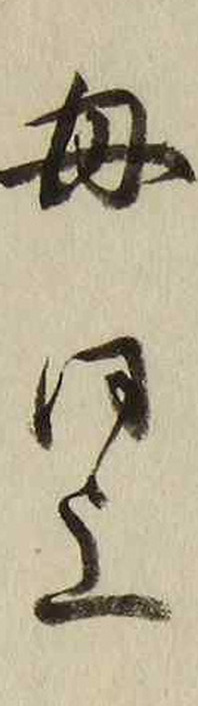母同上

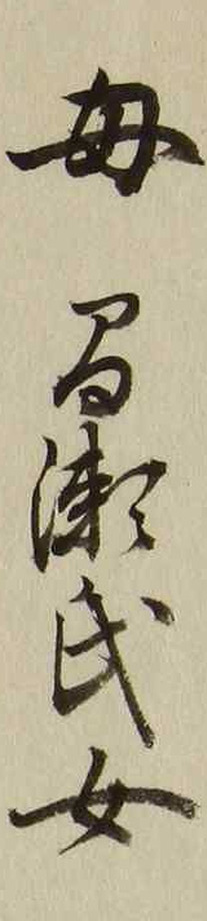母間瀬氏女
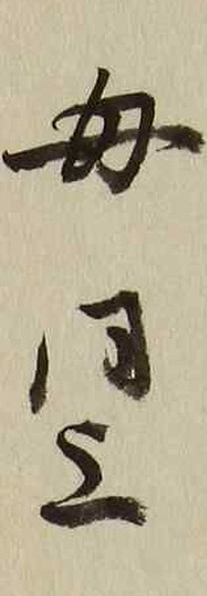母同上
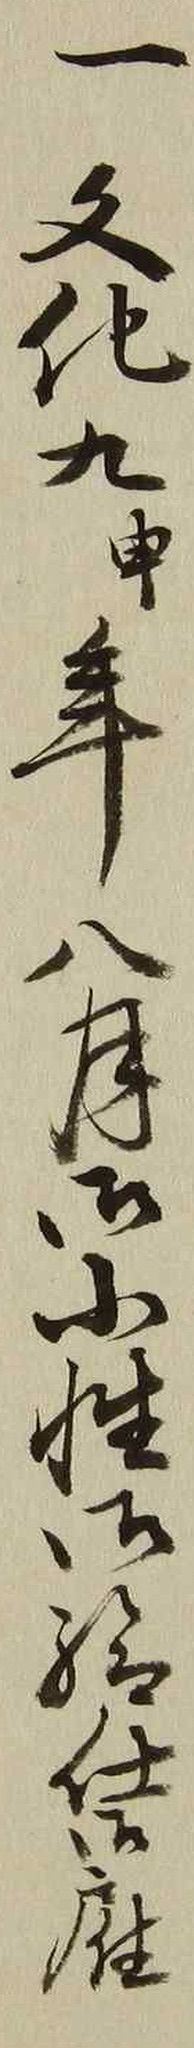一文化九申年八月御小性御給仕御雇
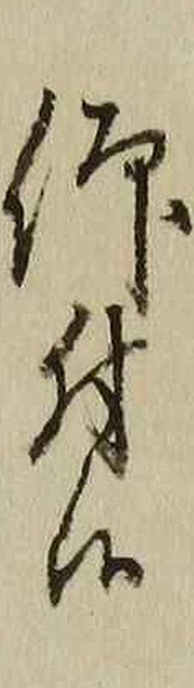仰付候
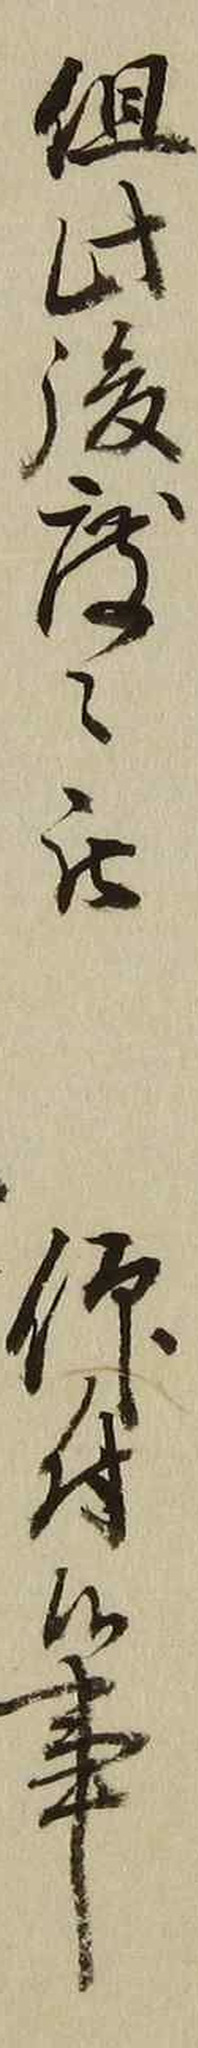但此後度々被仰付候事
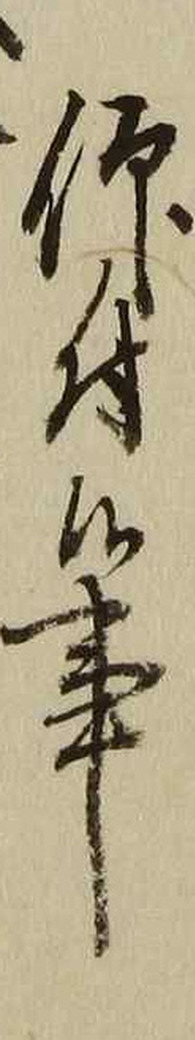仰付候事
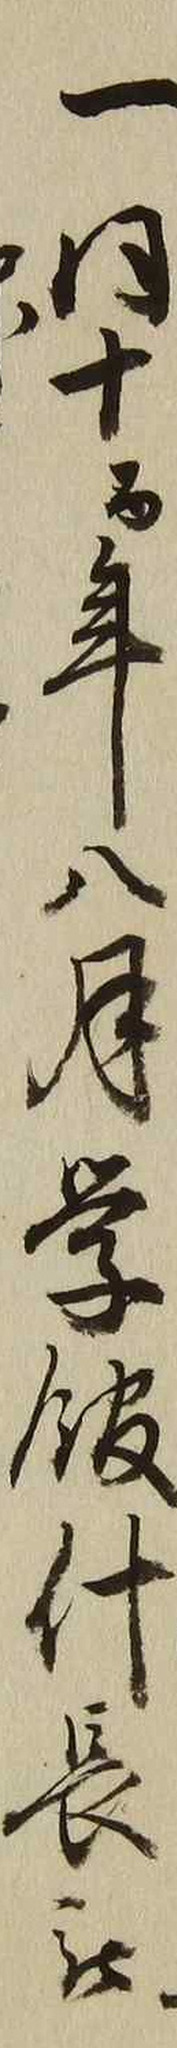一同十酉年八月学館什長被
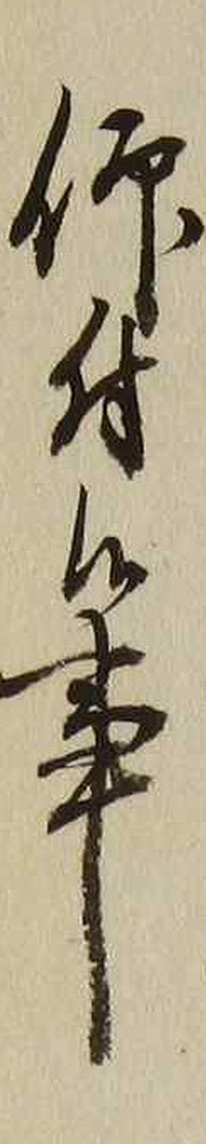仰付候事
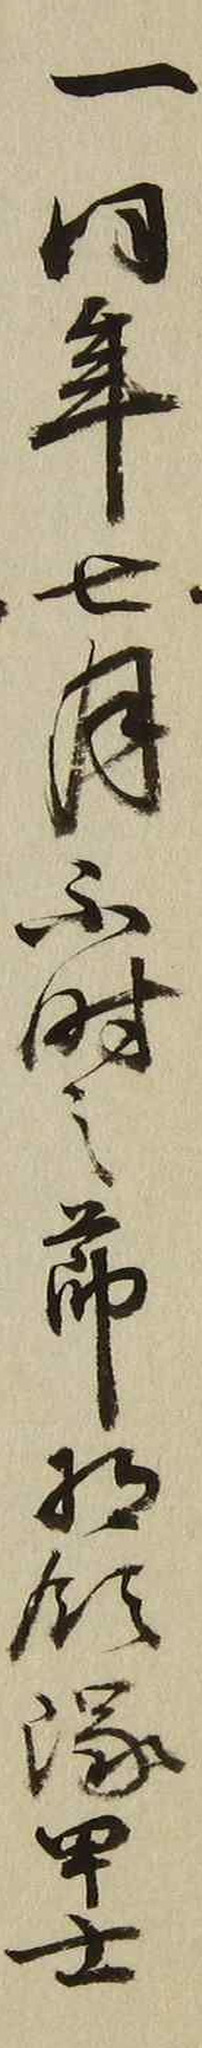一同年七月不時之節将領隊甲士
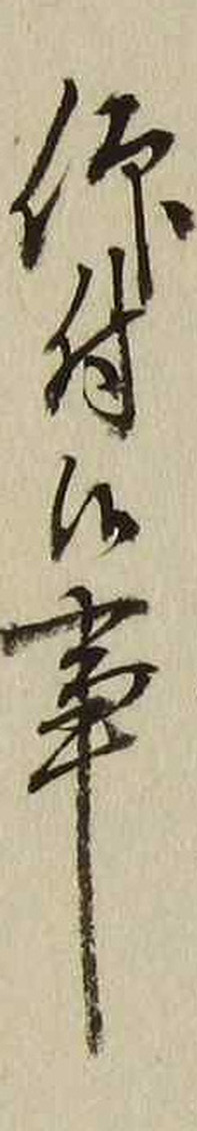仰付候事
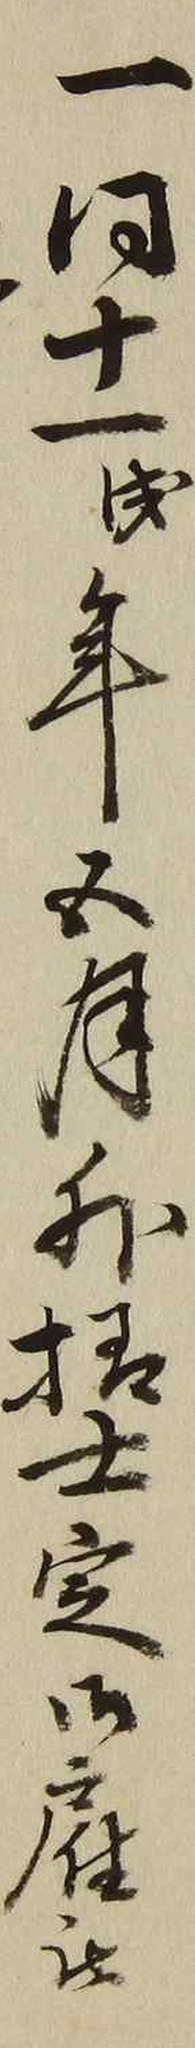一同十一戌年五月外様士定御雇被
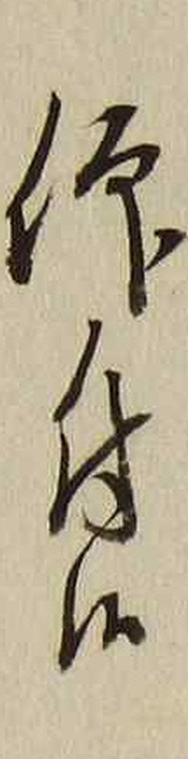仰付候
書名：諸士系譜　巻之35　は之部3
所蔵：会津若松市立会津図書館
